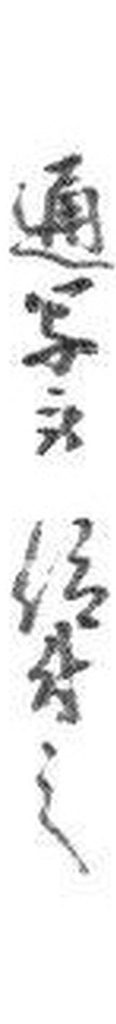通写被仰付之
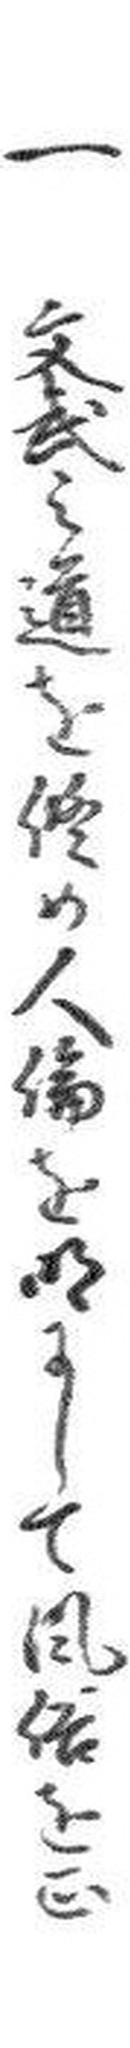一文武之道を修め人倫を明にして風俗を正
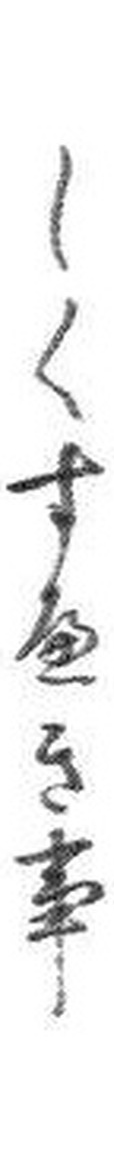しくすへき事
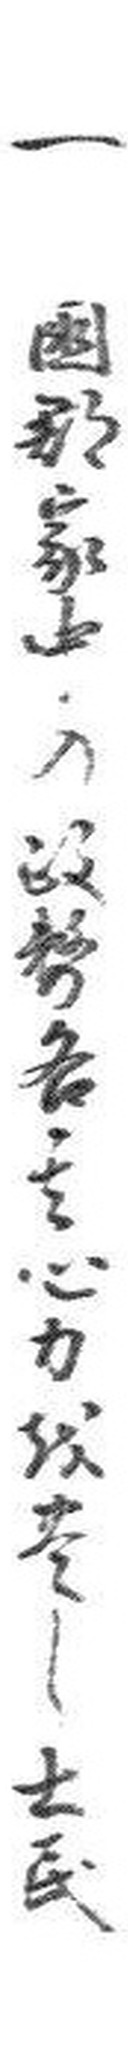一国郡家中の政務各其心力を尽し士民
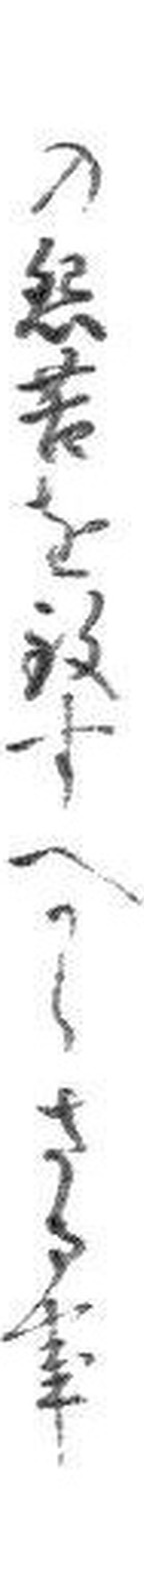の怨苦を致すへからさる事

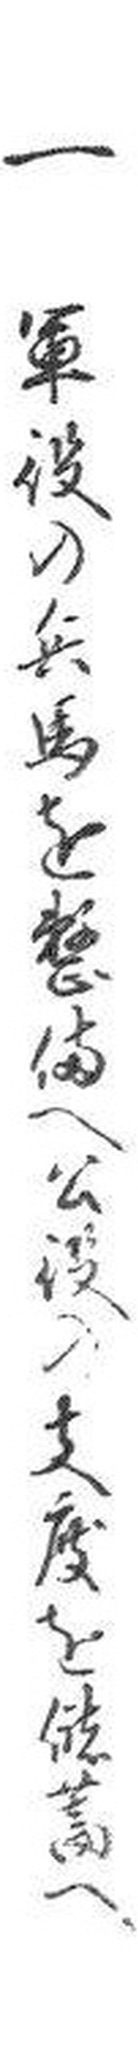一軍役の兵馬を整備へ公役の支度を儲蓄へ
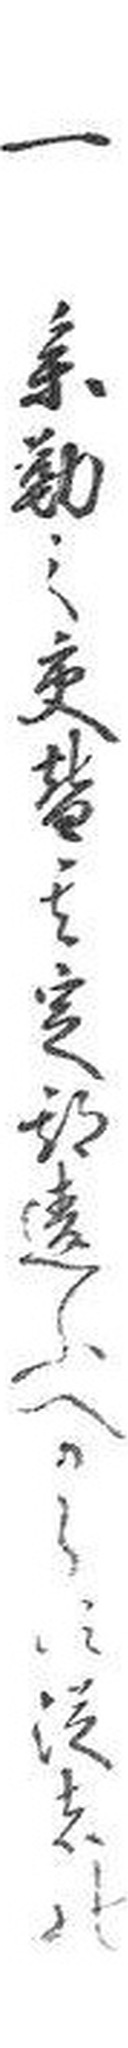一参勤之交替其定期違ふへからす従者の
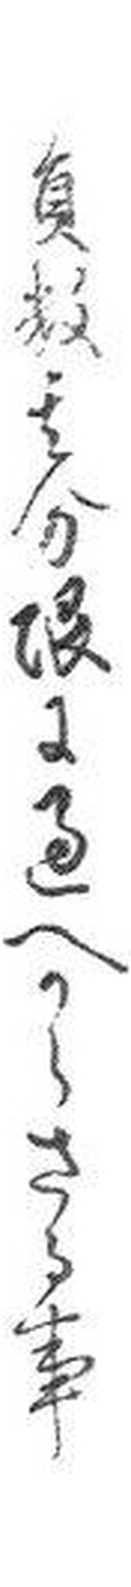員数其分限に過へからさる事
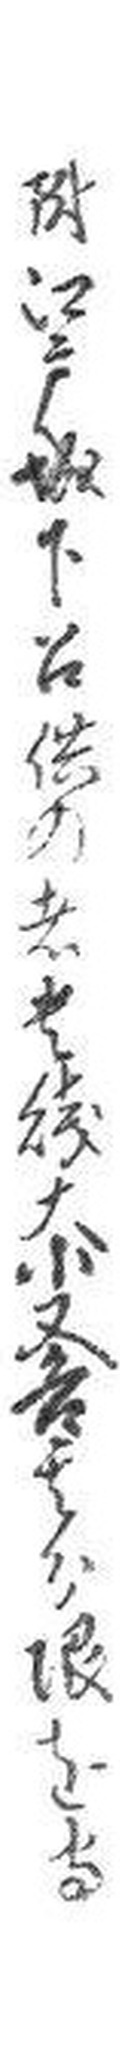附江戸城下召供の者貴賤大小又各其分限を守
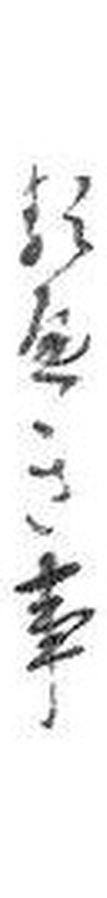るへき事
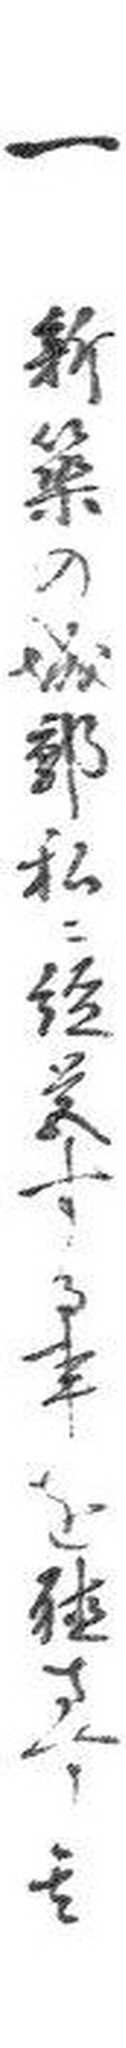一新築の城郭私ニ経営する事を聴さす其
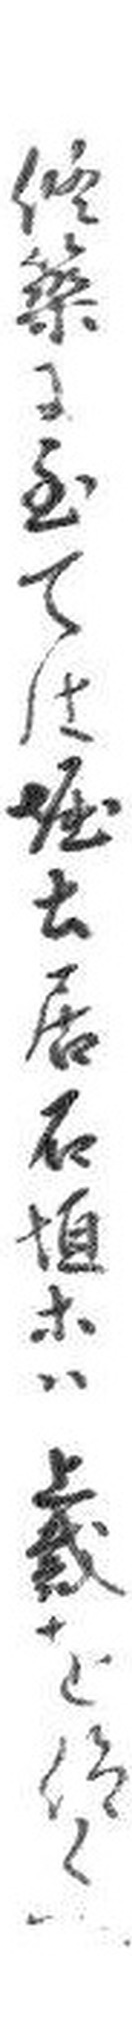修築に至ては堀土居石垣等は上裁を仰くへ
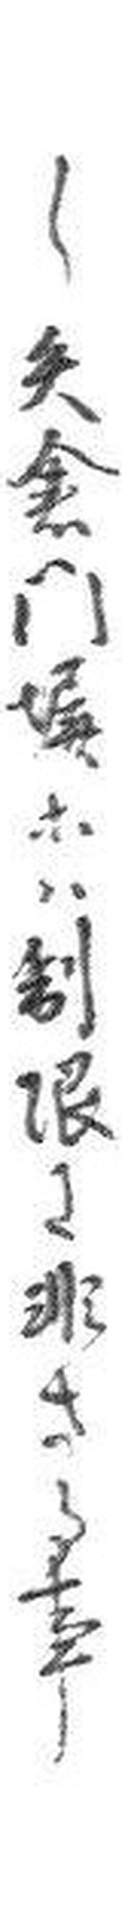し矢倉門塀等は制限に非さる事
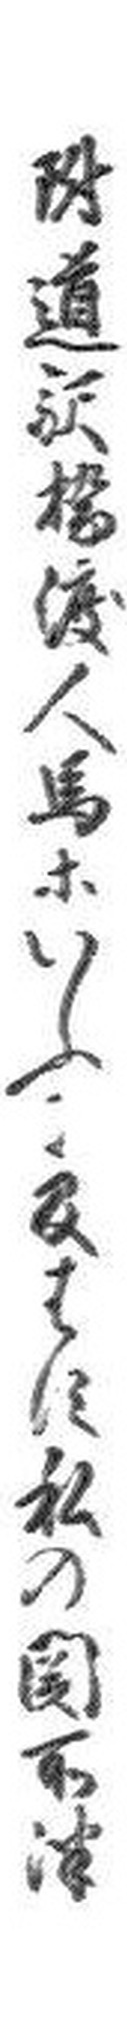附道駅橋渡人馬等いふに及はす私の関所津
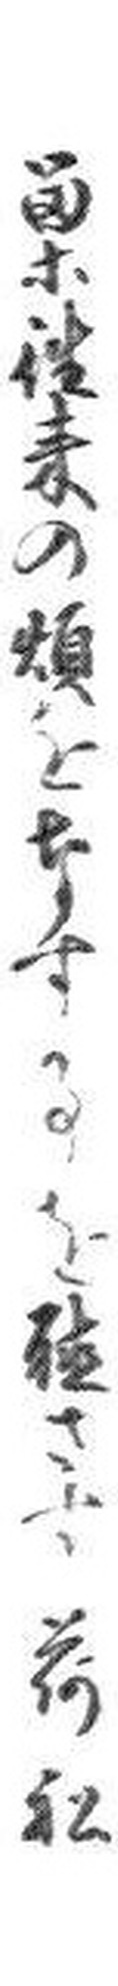留等往来の煩をなす事を聴さす荷船
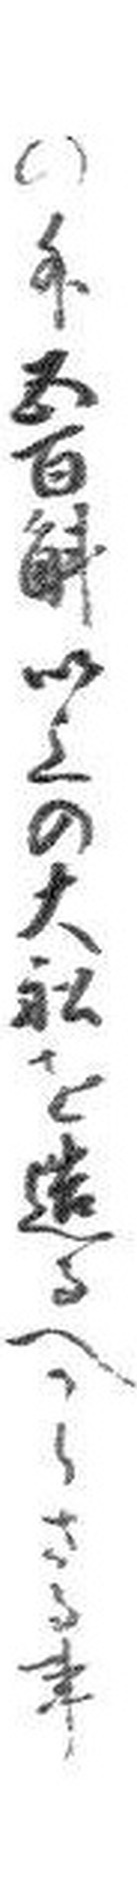の外五百斛以上の大船を造るへからさる事
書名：家譜 二十五 吉品公 従宝永六年到同七年
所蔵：福井県文書館 Fukui Prefectural Archives
